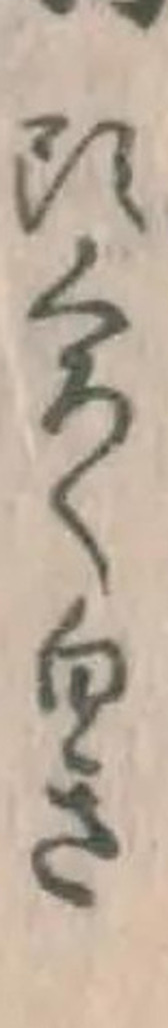頭くろく白き
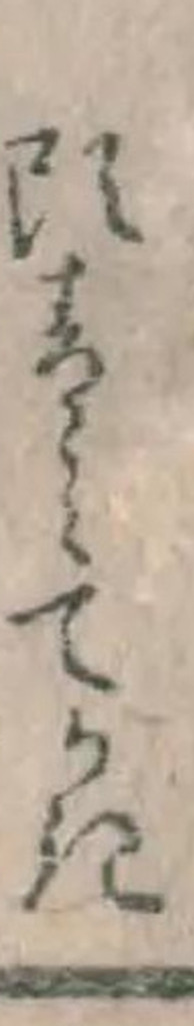頭青みてかき
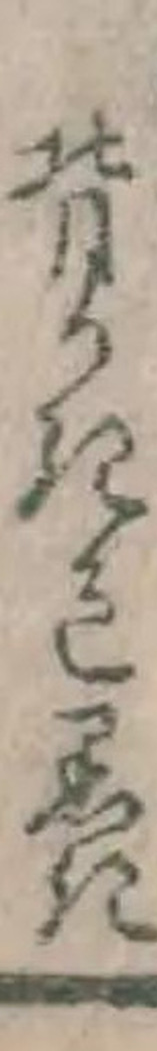背かき色黒き
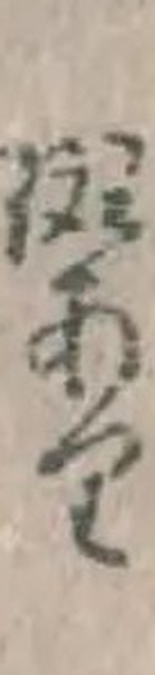斑あり
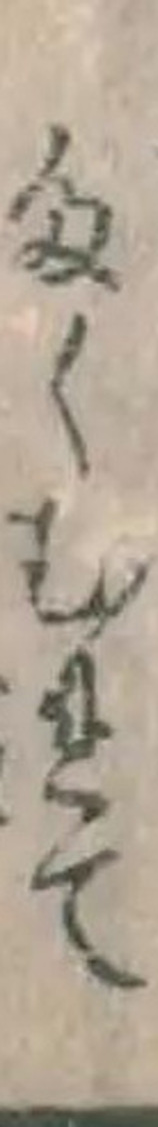多ゝむれて
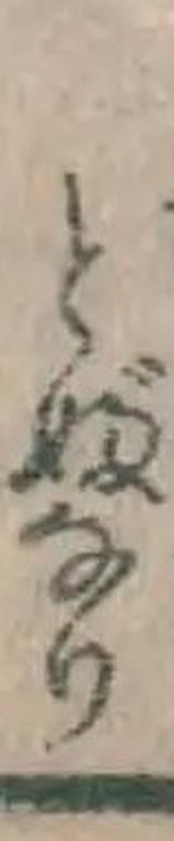とぶなり
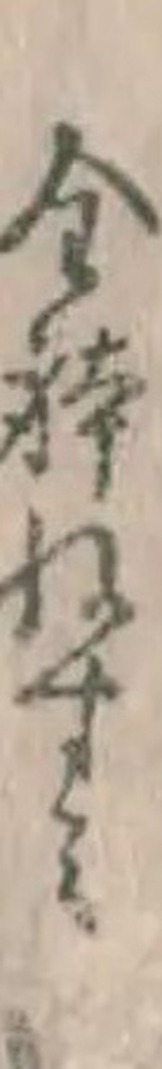全身ねすみ
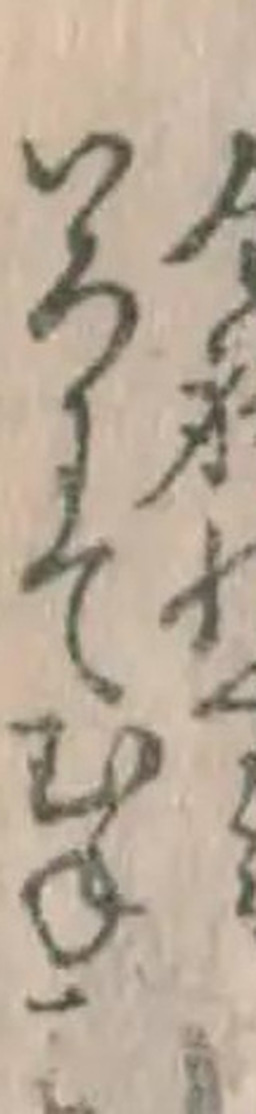いろにてむねはら
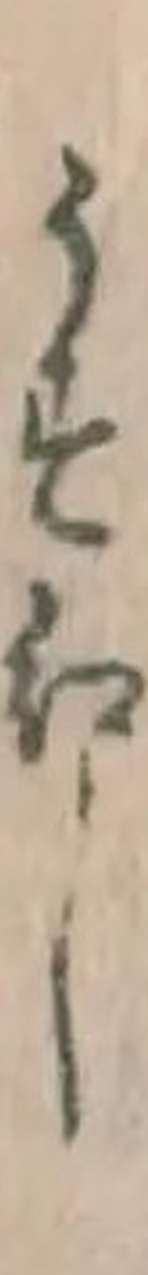うす紅し

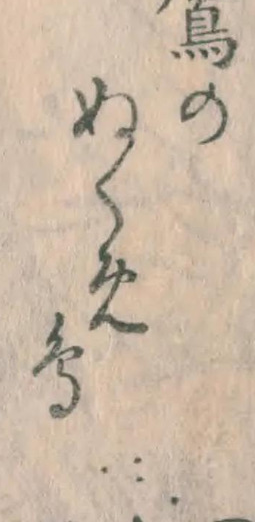ぬくめ鳥
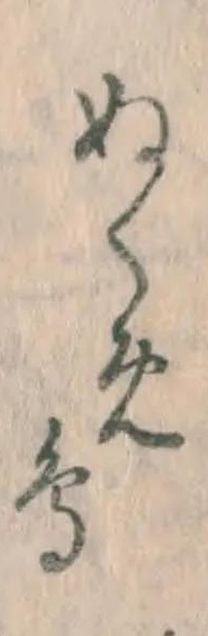ぬくめ鳥
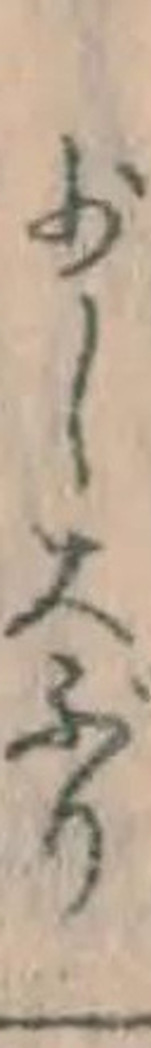少し大ぶり
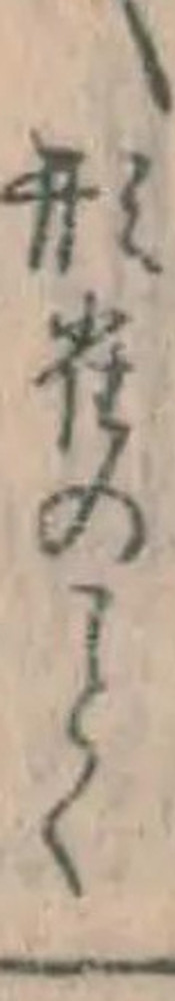形雀のことく
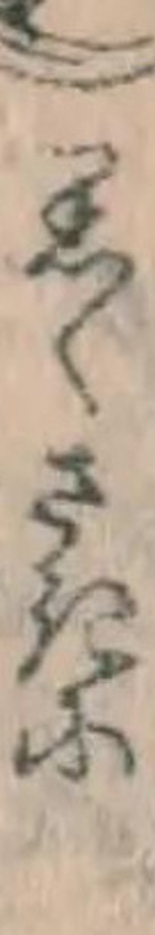黒くさきに
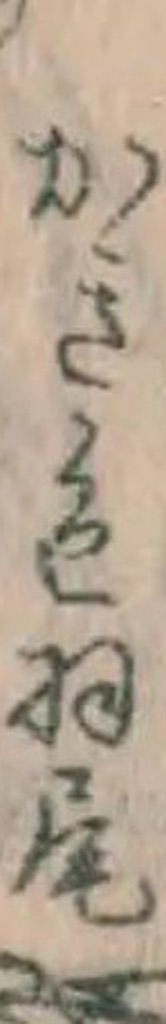かき色羽尾
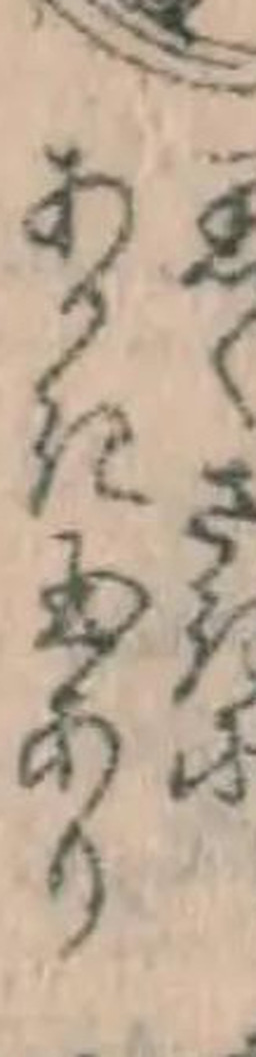あかき玉あり
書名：誹諧名知折 2巻. [2]
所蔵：国立国会図書館 National Diet Library, JAPAN
